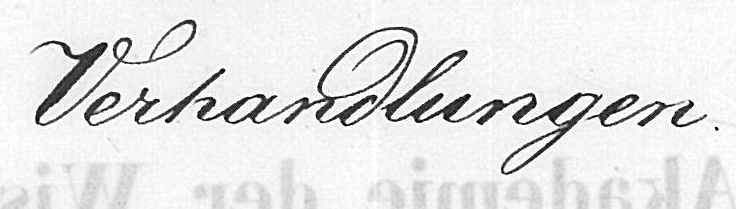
Verhandlungen
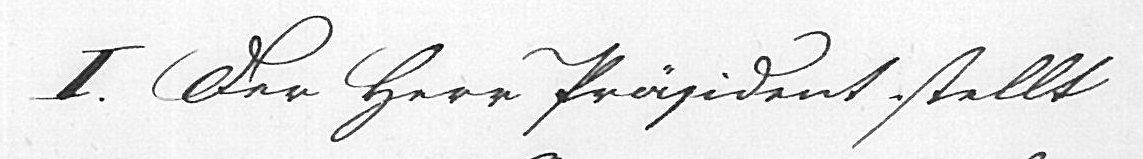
I. Der Herr Präsident stellt
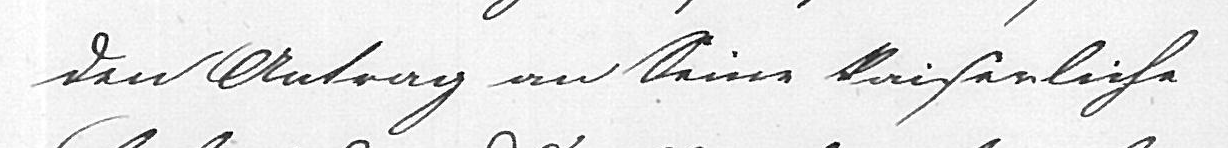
den Antrag an Seine kaiserliche
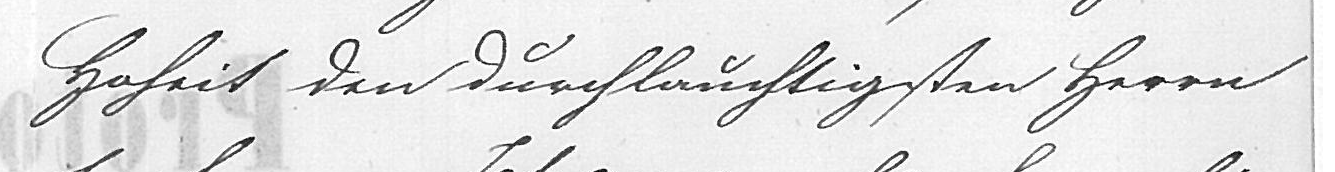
Hoheit den durchlauchtigsten Herrn
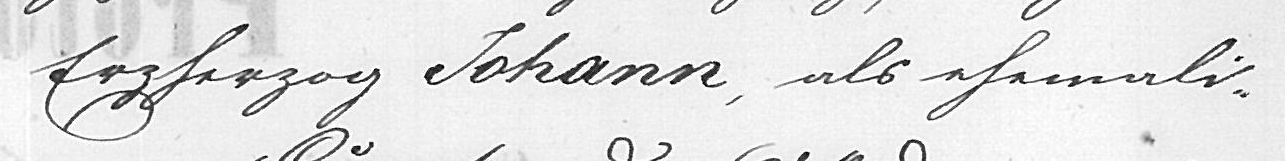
Erzherzog Johann, als ehemali-
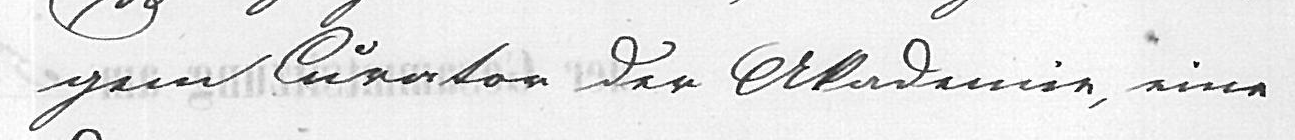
gem Curator der Akademie, eine
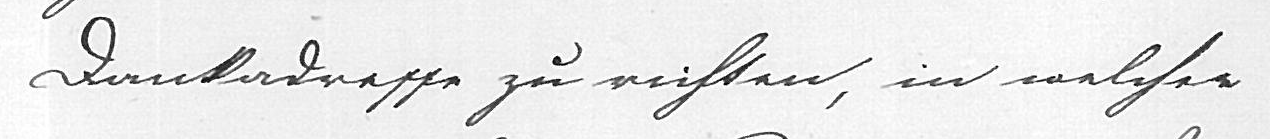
Dankadresse zu richten, in welcher
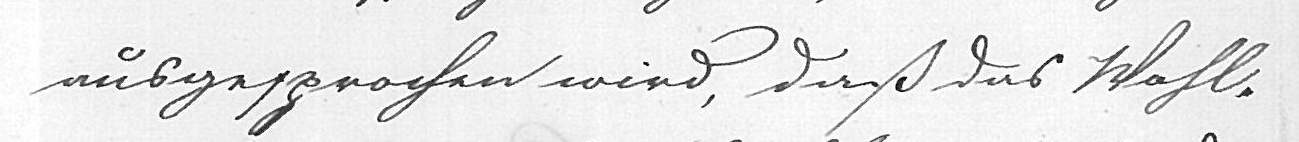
ausgesprochen wird, daß das Wohl-
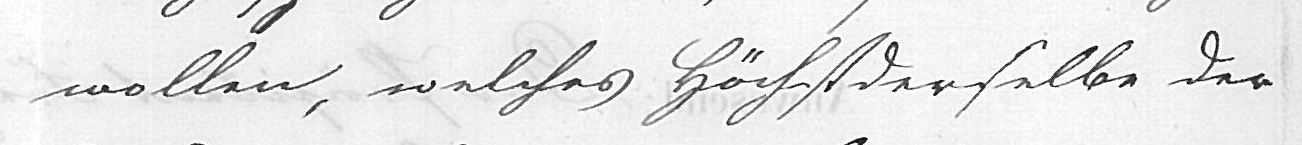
wollen, welches Höchstderselbe der
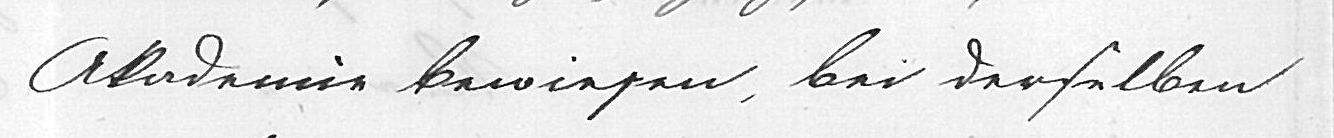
Akademie bewiesen, bei derselben
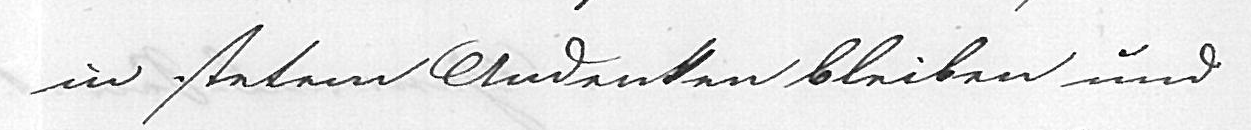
in stetem Andenken bleiben und
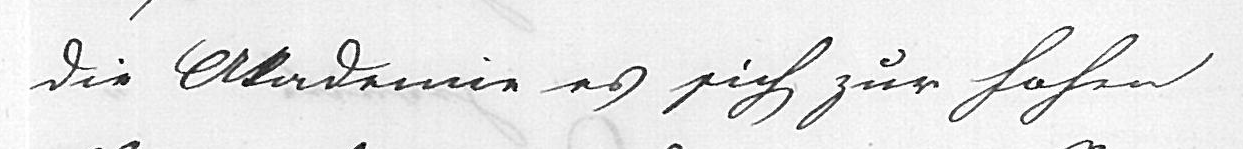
die Akademie es sich zur hohen
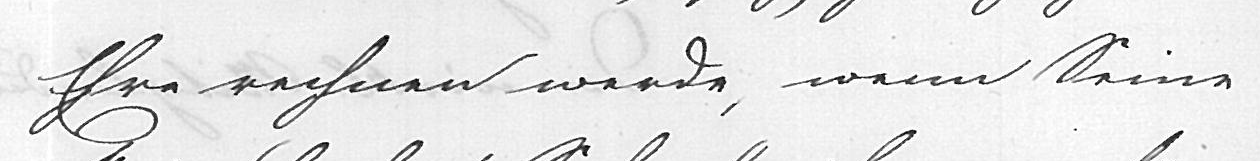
Ehre rechnen werde, wenn Seine
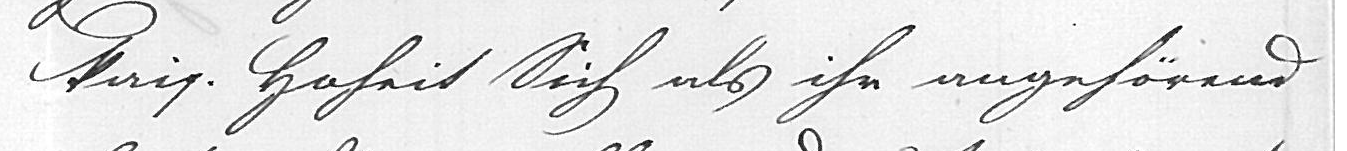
kais. Hoheit Sich, als ihr angehörend
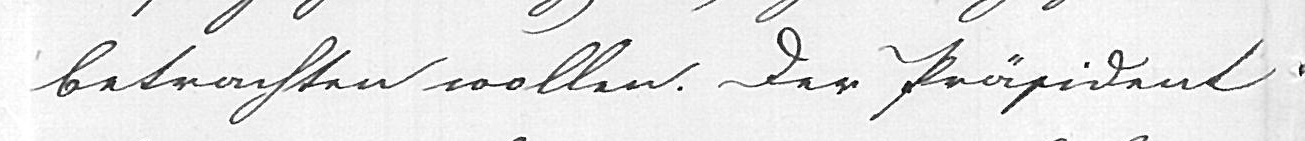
betrachten wollen. Der Präsident
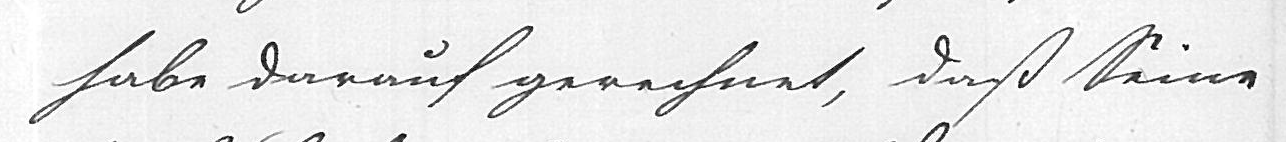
habe darauf gerechnet, daß Seine
